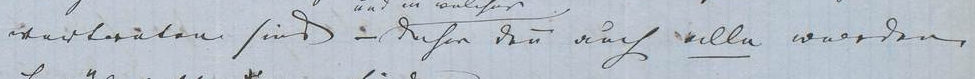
vertreten sind – und in welcher daher dann auch alle werden
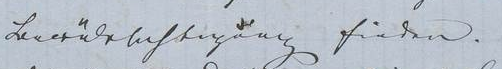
Berüksichtigung finden.
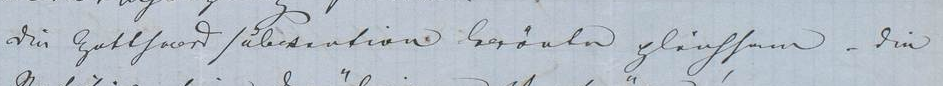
Die Gotthardsubvention krönte gleichsam die
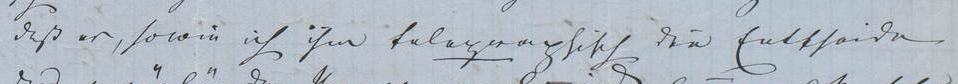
daß er, sowie ich ihm telegraphisch die Entscheide
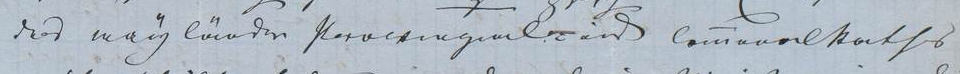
des mayländer Provinizial- und CommunalRaths
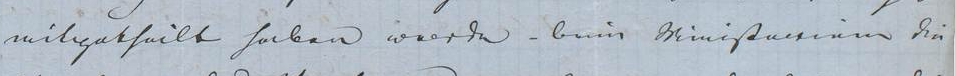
mitgetheilt haben werde – beim Ministerium die
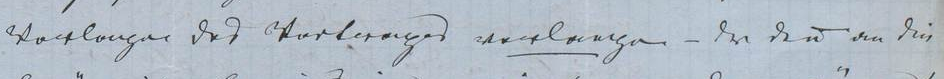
Vorlagen des Vertrags verlangen – der dann an die
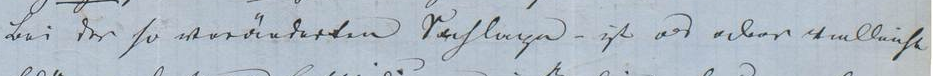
Bei der so veränderten Sachlage – ist es aber vielleicht
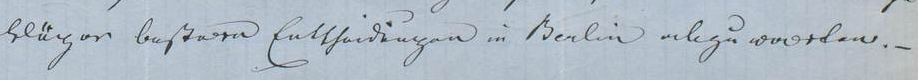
klüger beßere Entscheidungen in Berlin abzuwarten. –
